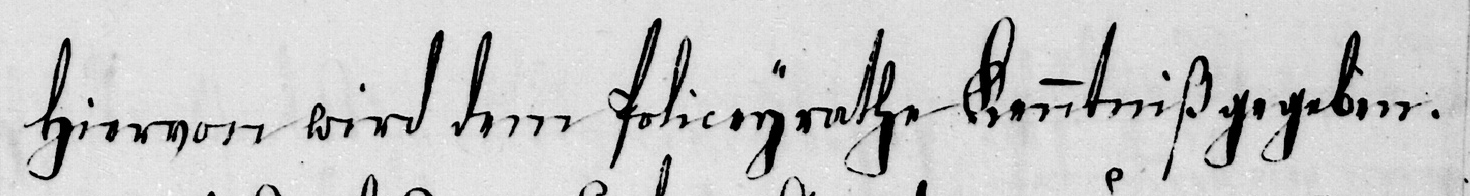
Hiervon wird dem Policeyrathe Kenntniß gegeben.
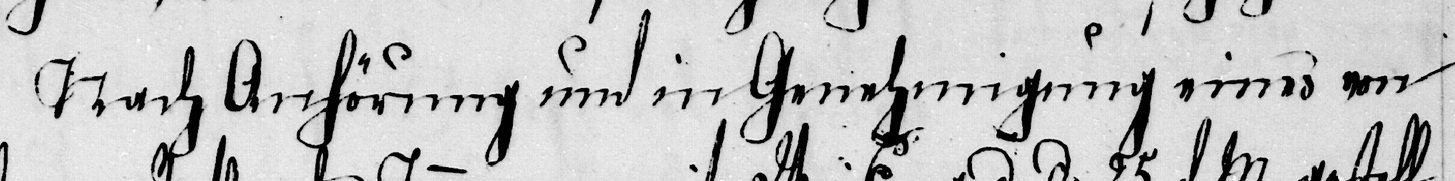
Nach Anhörung und in Genehmigung eines von
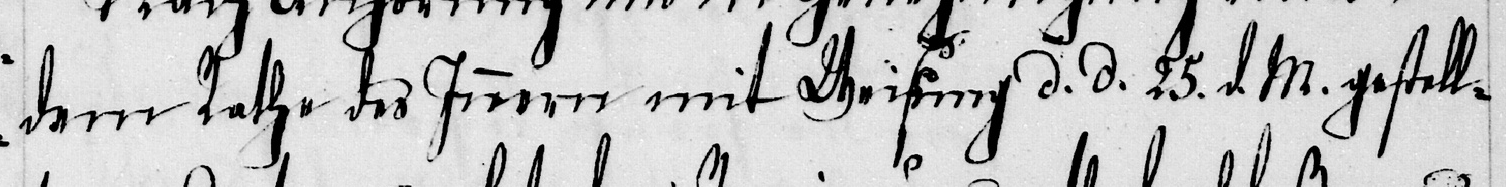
dem Rathe des Innern mit Weisung d. d. 25. d. M. gestell¬
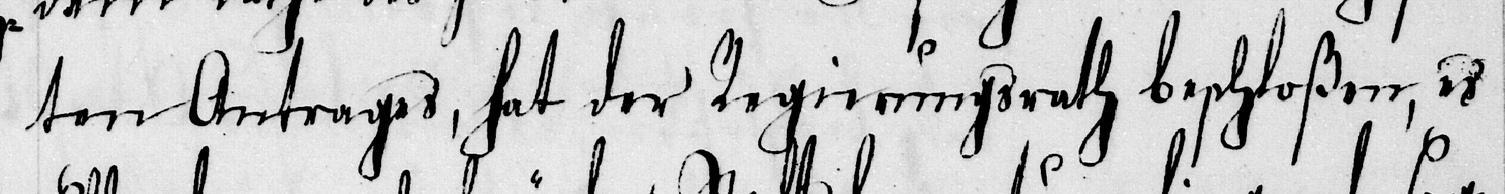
ten Antrages, hat der Regierungsrath beschloßen, es
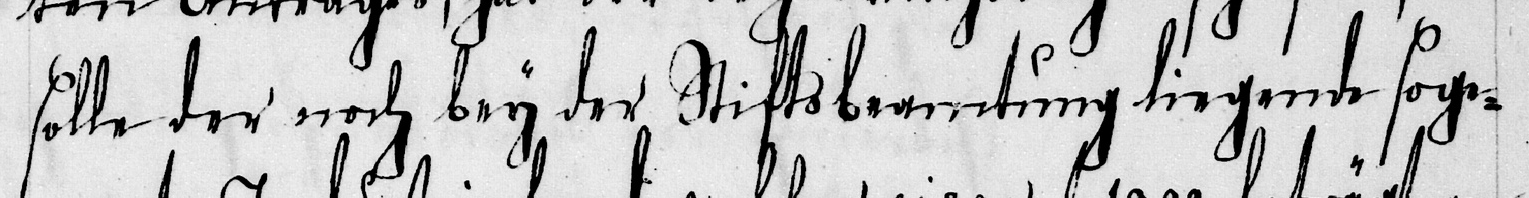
solle der noch bey der Stiftsbeamtung liegende soge¬
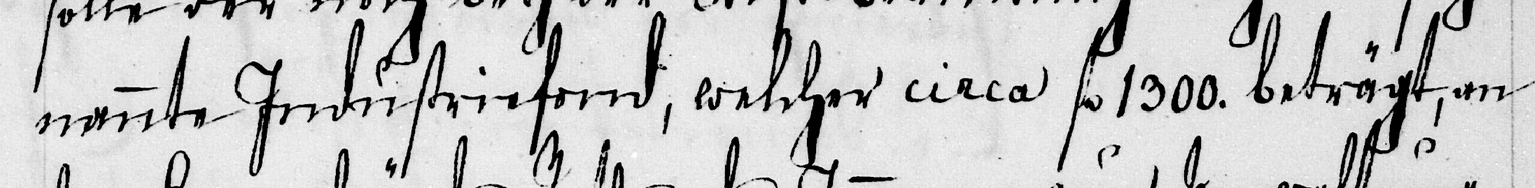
nannte Industriefond, welcher circa fl. 1300. beträgt, an
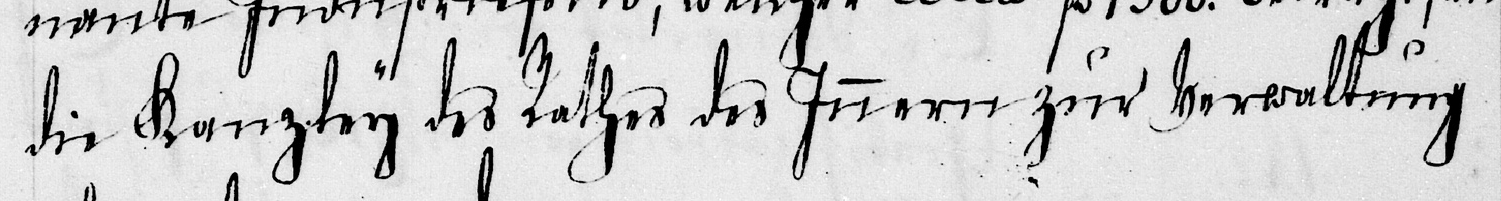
die Kanzley des Rathes des Innern zu Verwaltung
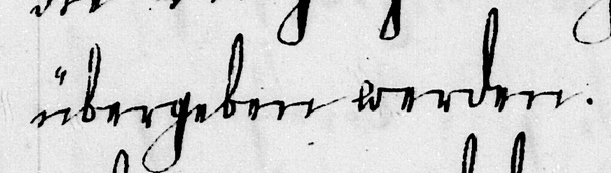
übergeben werden.
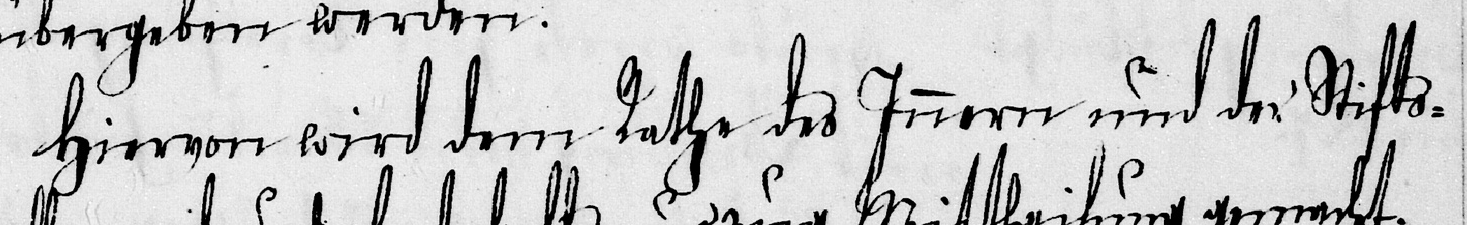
Hiervon wird dem Rathe des Innern und der Stifts¬
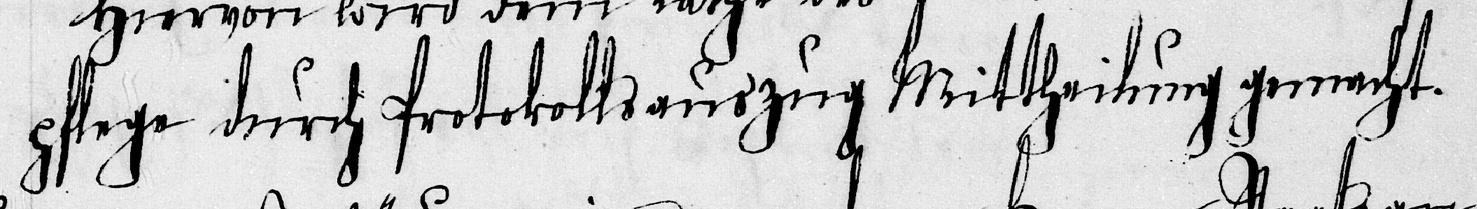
pflege durch Protokollsauszug Mittheilung gemacht.
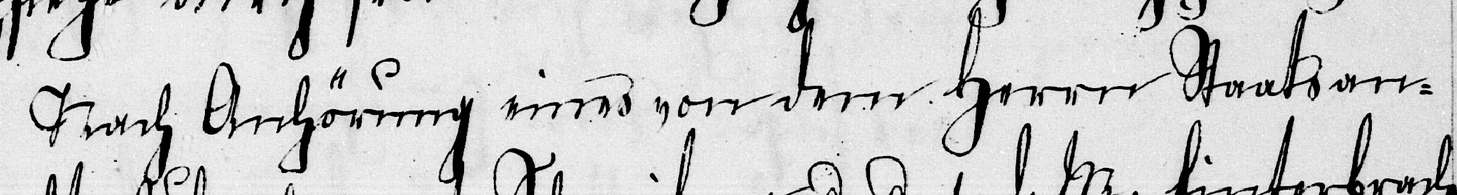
Nach Anhörung eines von dem Herrn Staatsan¬
